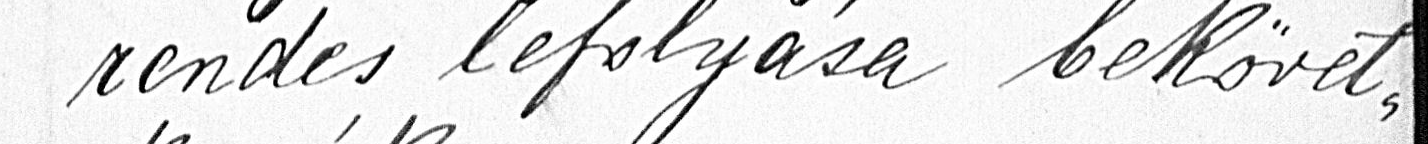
rendes lefslyása bekövet
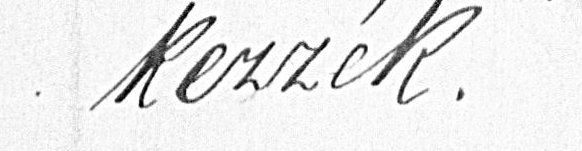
kezzék
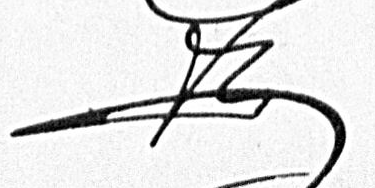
xx
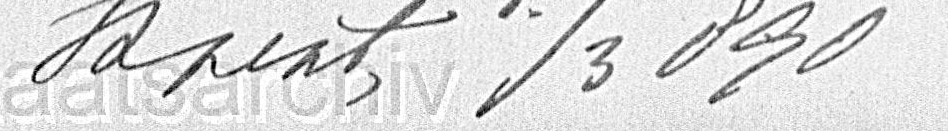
Bpest, 5./3 890
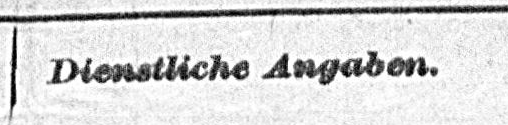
Dienstliche Angaben.
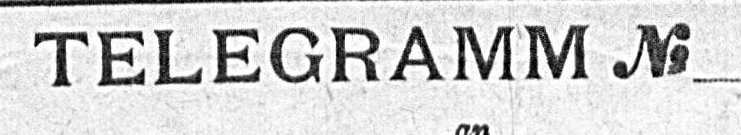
TELEGRAMM Nr.
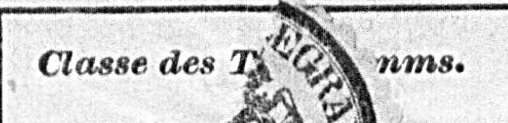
Classe des Txx
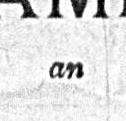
an
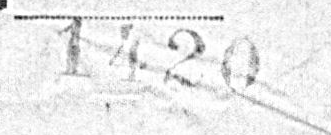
1420
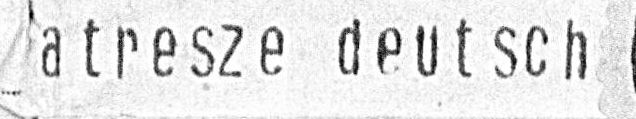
atresze deutsch
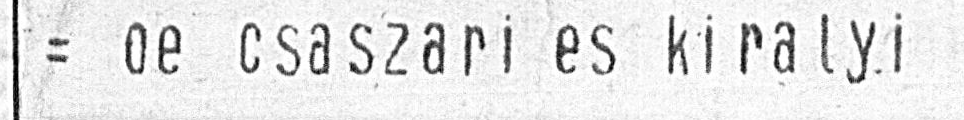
= oecsaszari es kiralyi
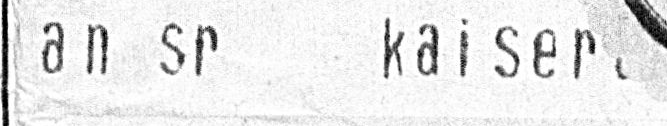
an sr kaiserxx
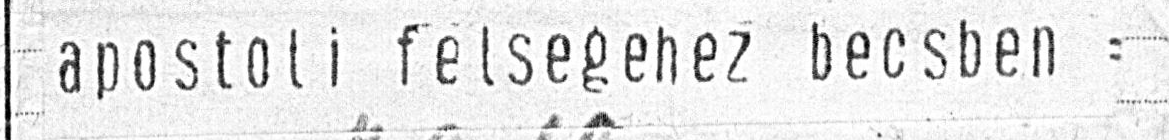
apostoli felsegehez becsben =
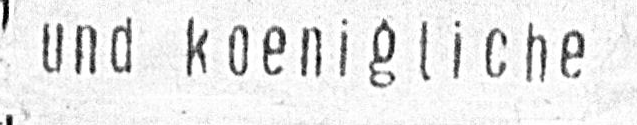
und koenigliche
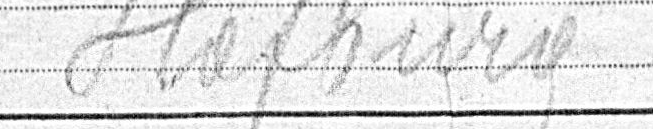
Hofburg
